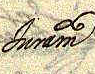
Iuramto
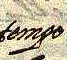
tempo
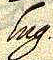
lug.
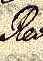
Reo
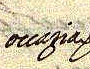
occaziaõ
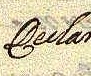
Declar.
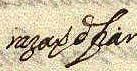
razaõ d̄ fiar
